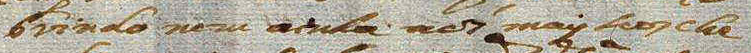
brindo nem ainda aos mais seos che
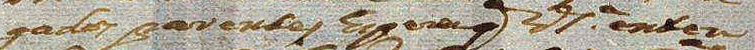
gados parentes espera q̄ VS.a enten
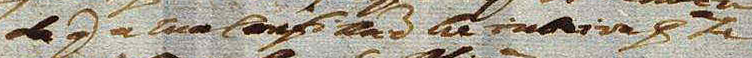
da q̄ a sua confiçaõ he inteira pa se
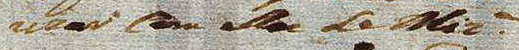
uzar com ella de Miz.a
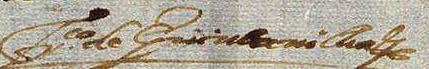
Fr.co de Quintanilha
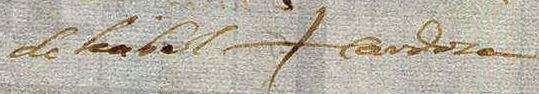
de Izabel + cardoza
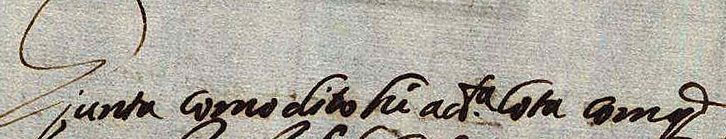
E junta como dito hé a d̄.a Cota com q̄
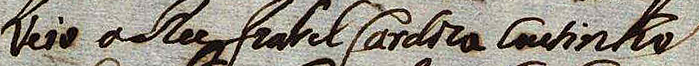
veio a Ree Jzabel Cardoza Coutinho
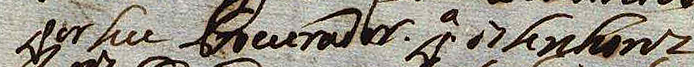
por seu Procurador p.a os senhores
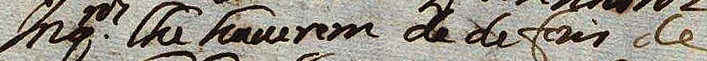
Inq.res lhe hauerem de deferir de
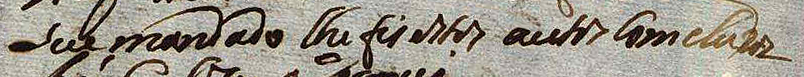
seu mandado lhe fiz estes auto concluzos
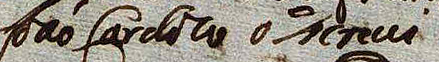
João Cardozo o Escreui
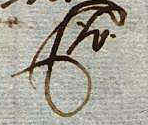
CLo.
